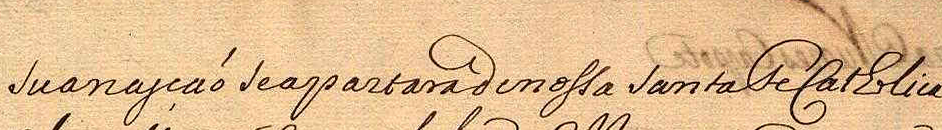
sua nasçaõ se apartara de nossa santa Fe Catholica
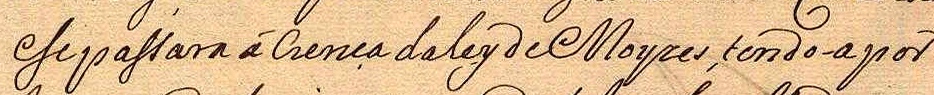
e se passara á Crença da ley de Moyzes, tendo-a por
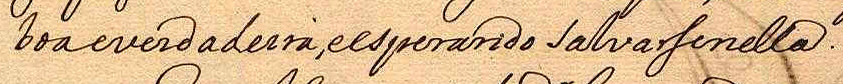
boa e verdadeira, e esperando salvarse nella.
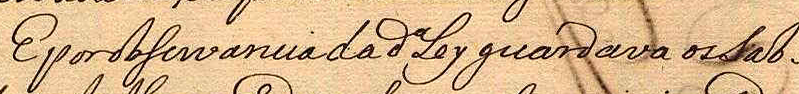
E por observancia da da Ley guardava os Sab.
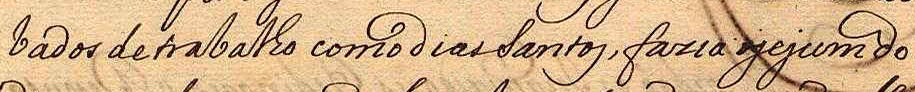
bados de trabalho como dias Santos, fazia o jejum do
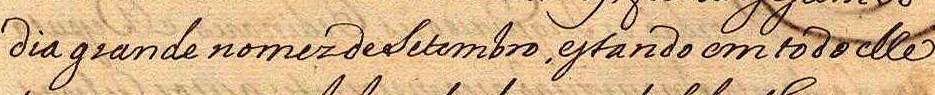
dia grande no mez de Setembro, estando em todo elle
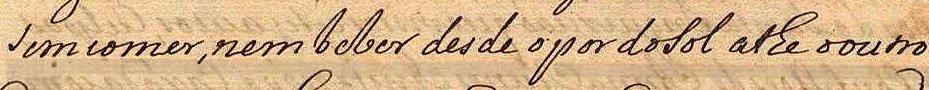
sem comer, nem beber desde o por do sol athe o outro
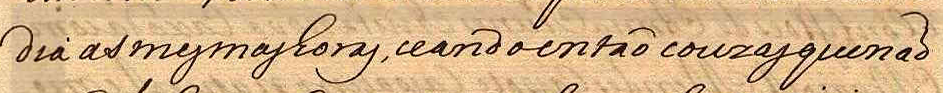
dia as mesmas horas, ceando entaõ couzas que naõ
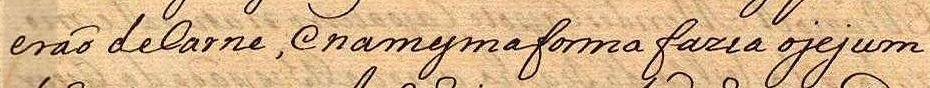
eraõ de Carne, e na mesma forma fazia o jejum
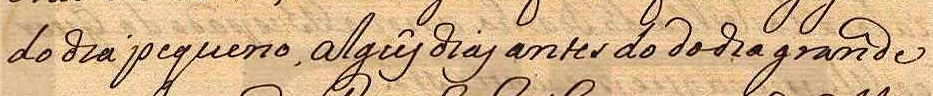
do dia pequeno, algūs dias antes do do dia grande
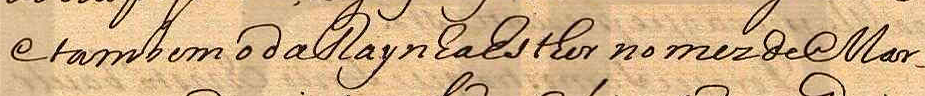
e tambem o da Raynha Esther, no mez de Mar
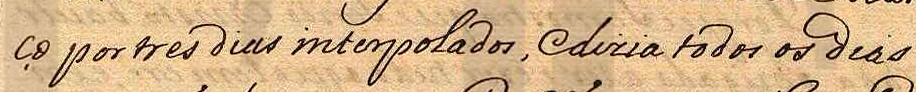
ço por tres dias interpolados, e dizia todos os dias
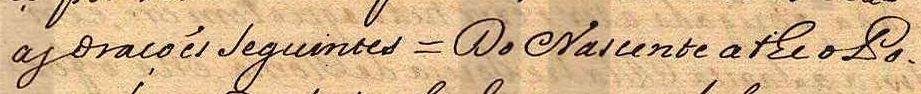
as oraçoẽs seguintes = Do Nascente athe o Po
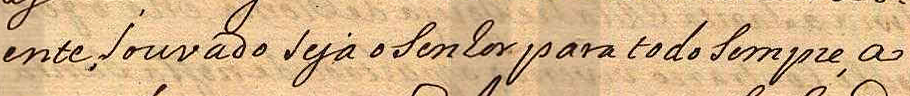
ente, louvado seja o Senhor para todo sempre a
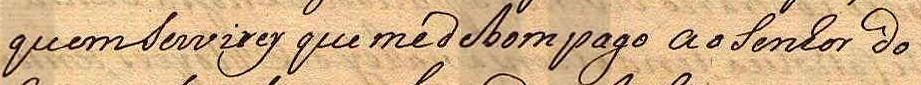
quem servirey que me de bom pago ao Senhor do
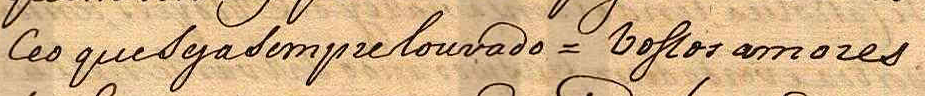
Ceo que seja sempre louvado = Vossos amores
